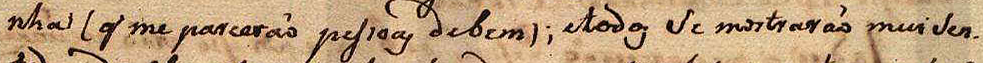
nha (q̄ me parceraõ pessoas de bem); e todos se mostraraõ mui sen
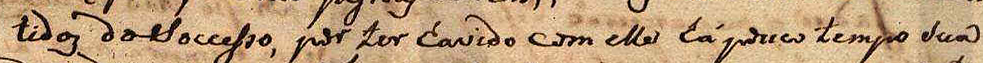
tidos do Soccesso, por ter havido com elle há pouco tempo sua
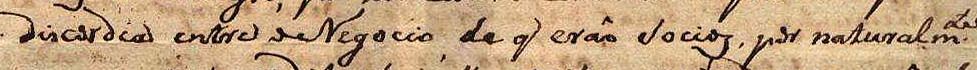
discordia entre o Negocio de q̄ eraõ socios, por naturalm.te
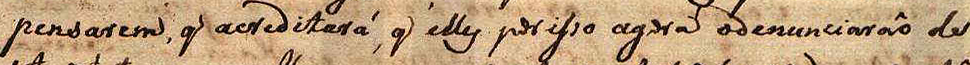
pensarem, q̄ acreditará, q̄ elles por isso agora o denunciaraõ de
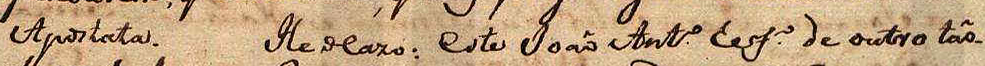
Apostata. He o cazo: Este Ioaõ Ant.o he f.o de outro taõ
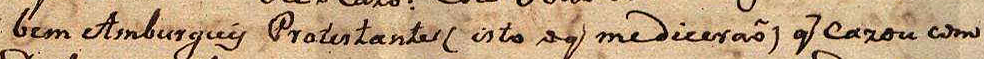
bem Amburgués Protestante (isto o q̄ me diceraõ) q̄ cazou com
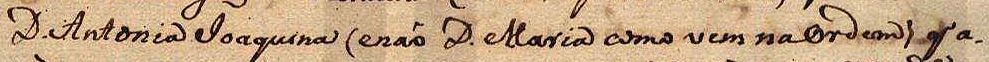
D. Antonia Ioaquina (e naõ D. Maria como vem na Ordem) q̄ a
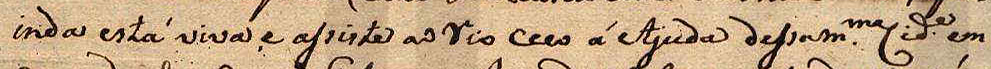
inda está viva, e assiste ao Rio ceco á Ajuda dessa m.ma Cid.e em
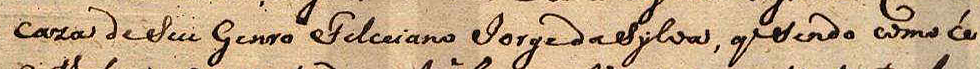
caza de seu Genro Feleciano Iorge da Sylva, q̄ sendo como he
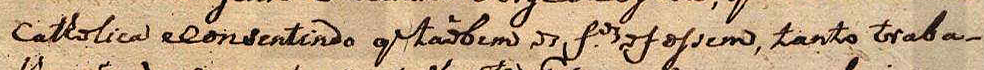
catholica e consentindo q̄ taõbem os f.os o fossem, tanto traba
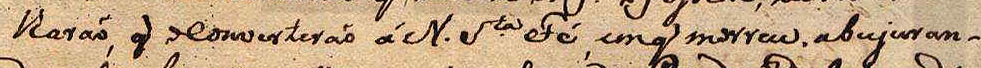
lharaõ, q̄ o converteraõ á N. S.ta Fé em q̄ morreu abujuran
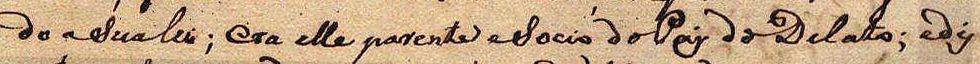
do a Sua lei; era elle parente e Socio do Pay do Delato; e dis
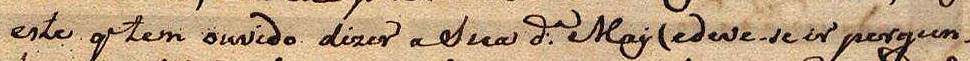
este q̄ tem ouvido dizer a Sua d.a May (e deve-se ir pergun
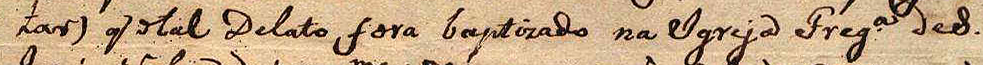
tar q̄ o tal Delato, fora baptizado na Igreja Freg.a de S.
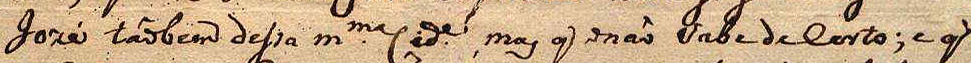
Jozé taõbem dessa m.ma Cid.e, mas q̄ o naõ sabe de certo; e q̄
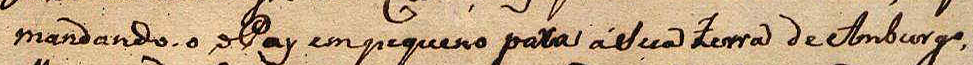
mandando-o o Pay em pequeno para a Sua terra de Amburgo,
